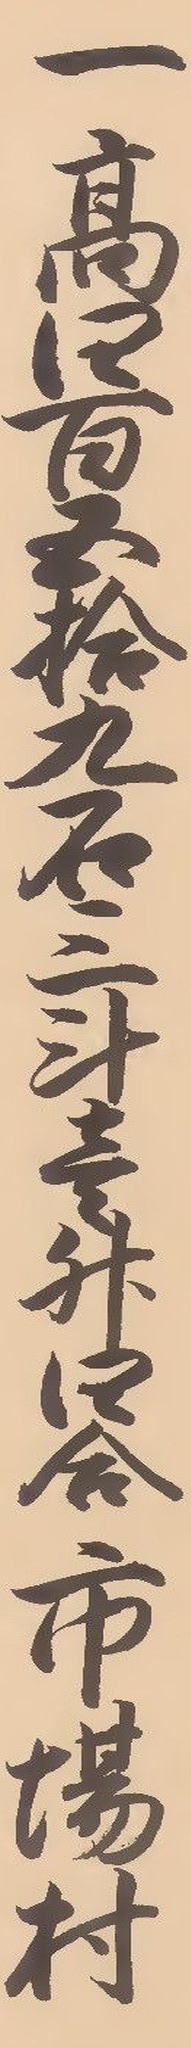一高四百五拾九石三斗壱升四合市場村
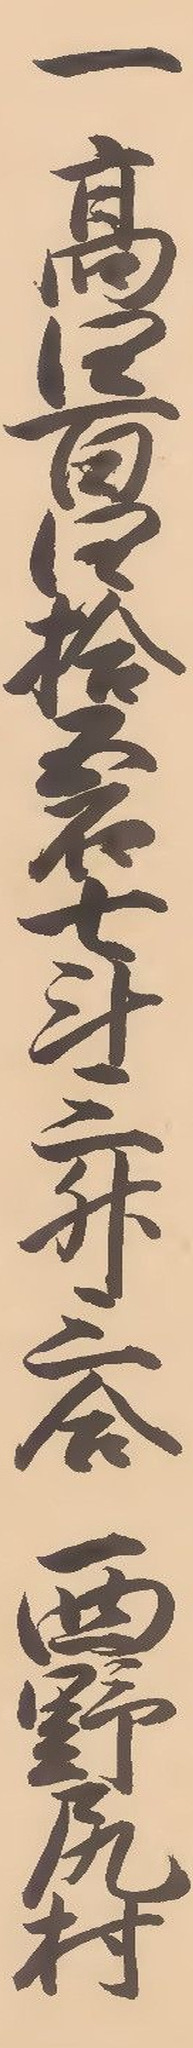一高四百四拾五石七斗三升三合西野尻村
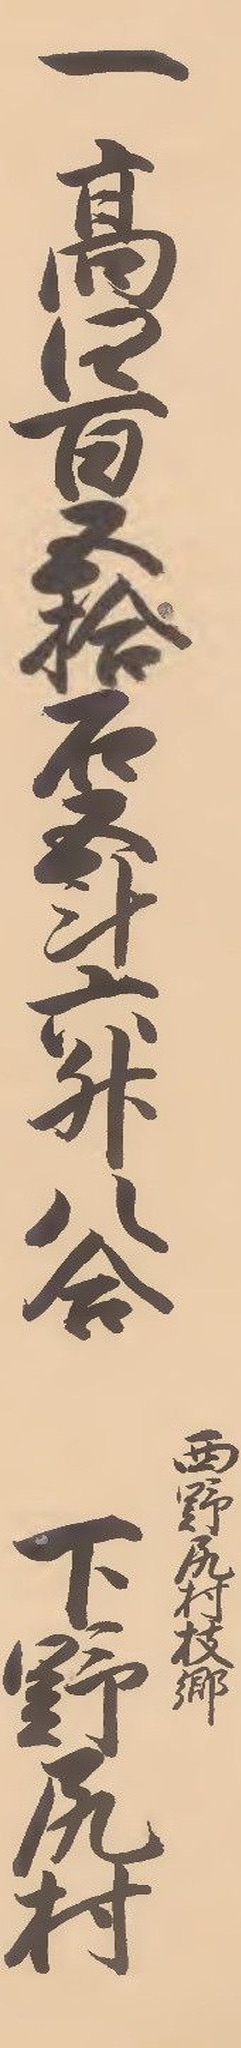一高四百四拾五石七斗三升三合西野尻村

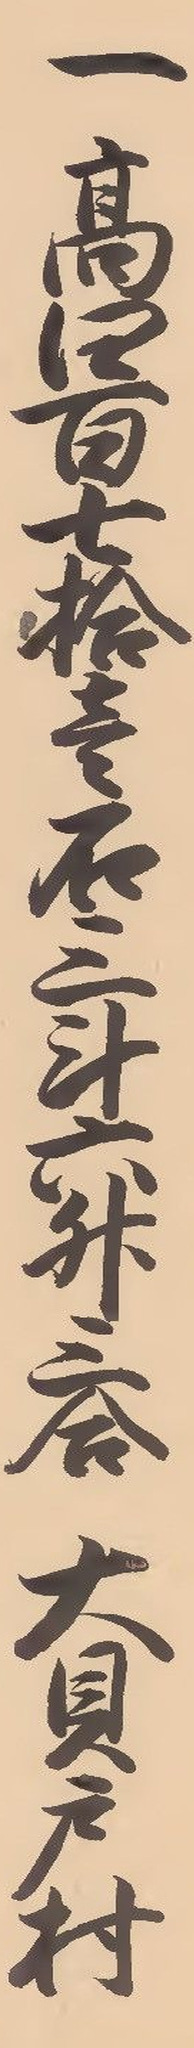一高四百七拾壱石三斗六升三合大貝戸村
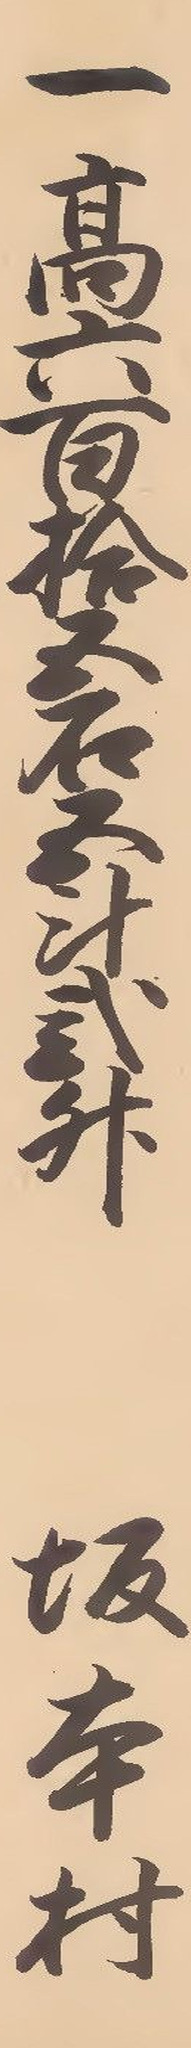一高六百拾五石五斗弐升坂本村
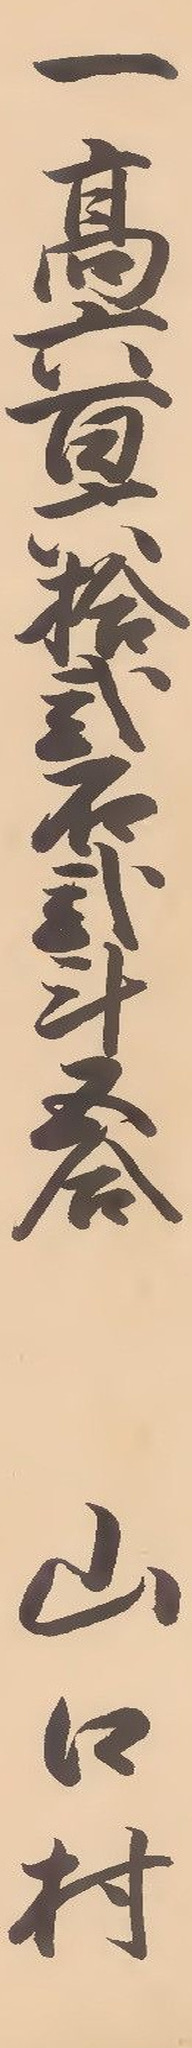一高六百六拾弐石弐斗五合山口村
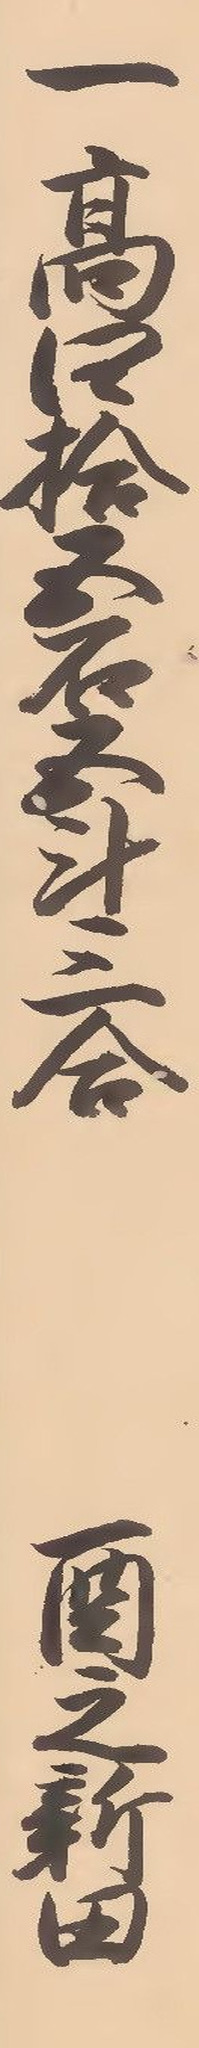一高四拾五石五斗三合酉之新田
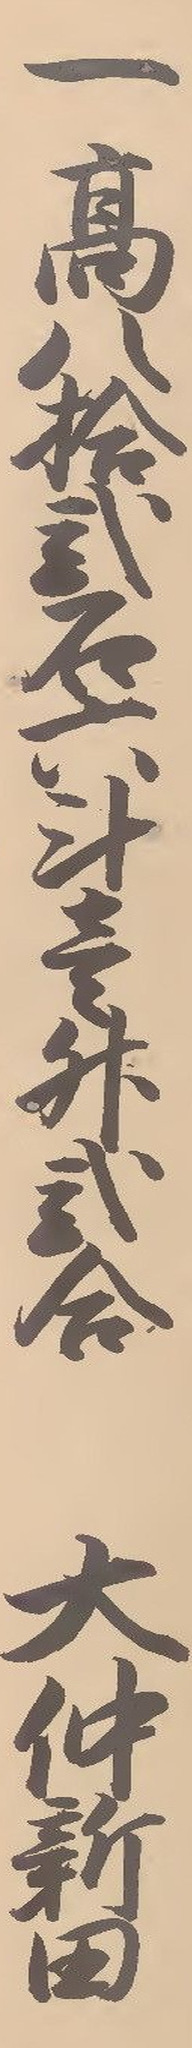一高八拾弐石六斗壱升弐合大仲新田
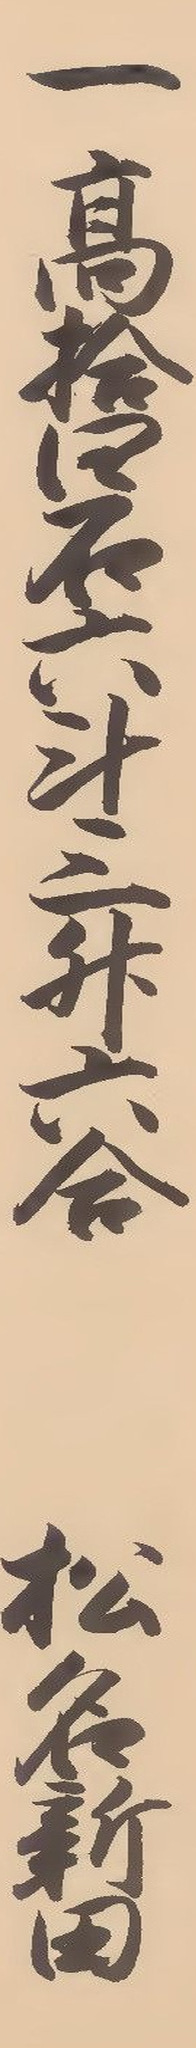一高拾四石六斗三升六合松名新田
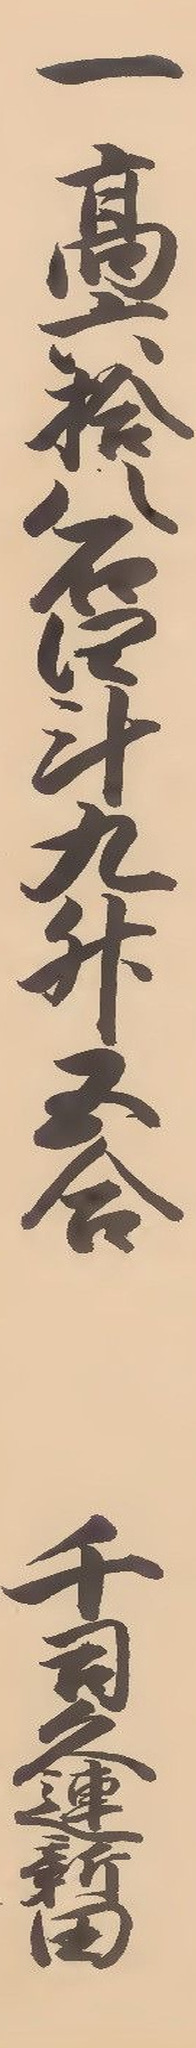一高六拾八石四斗九升五合千司久連新田
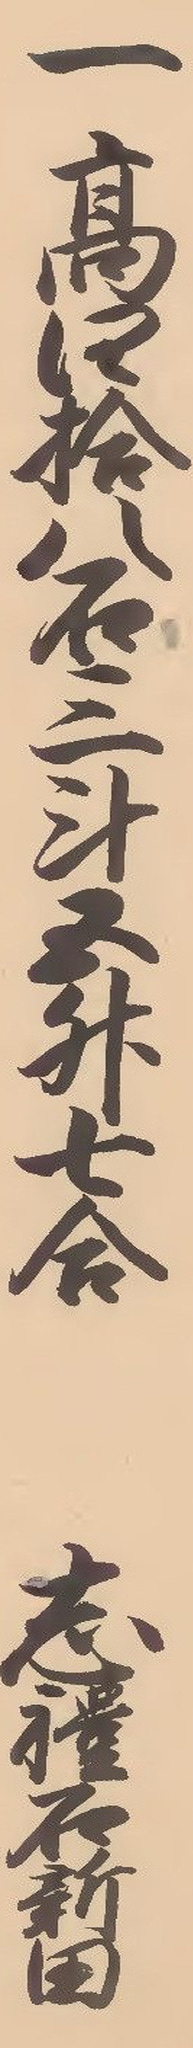一高四拾八石三斗五升七合志礼石新田

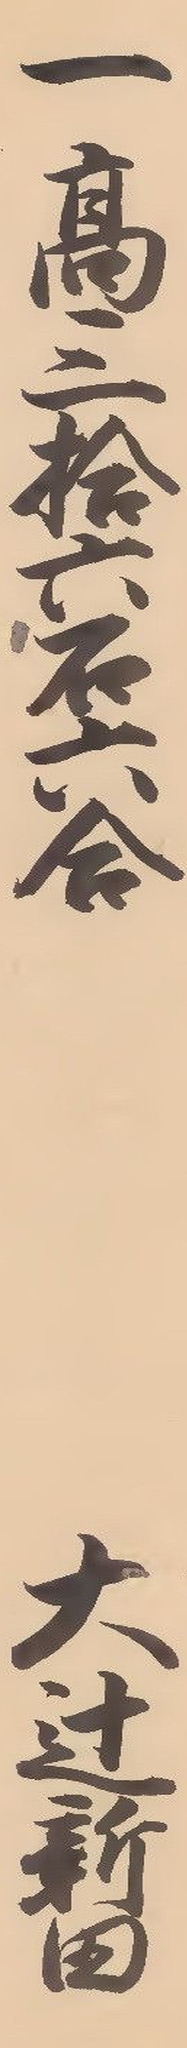一高三拾六石六合大辻新田
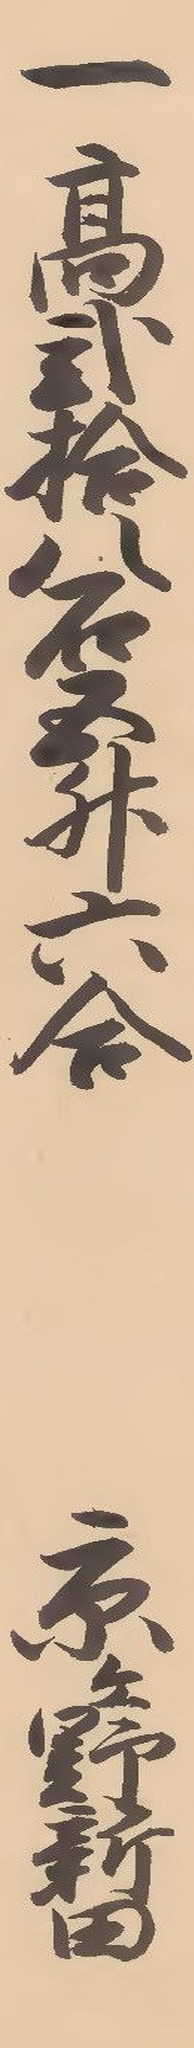一高弐拾八石五升六合京ヶ野新田
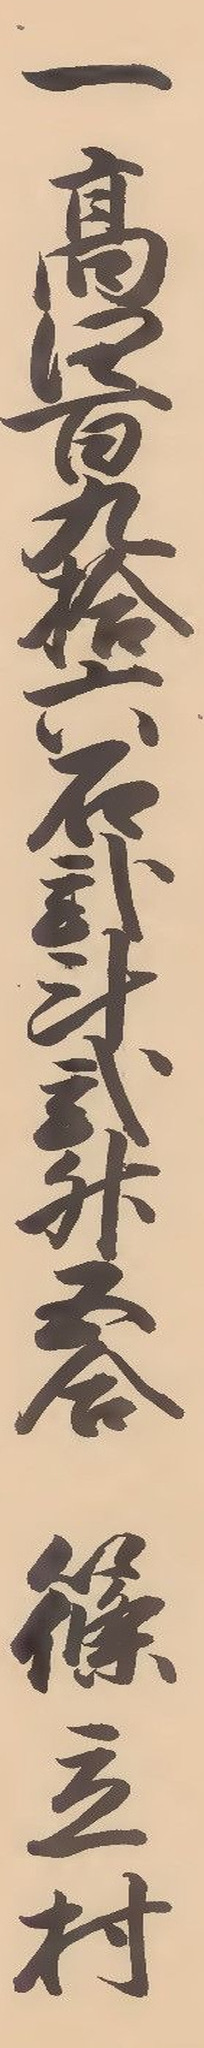一高四百九拾六石弐斗弐升五合篠立村
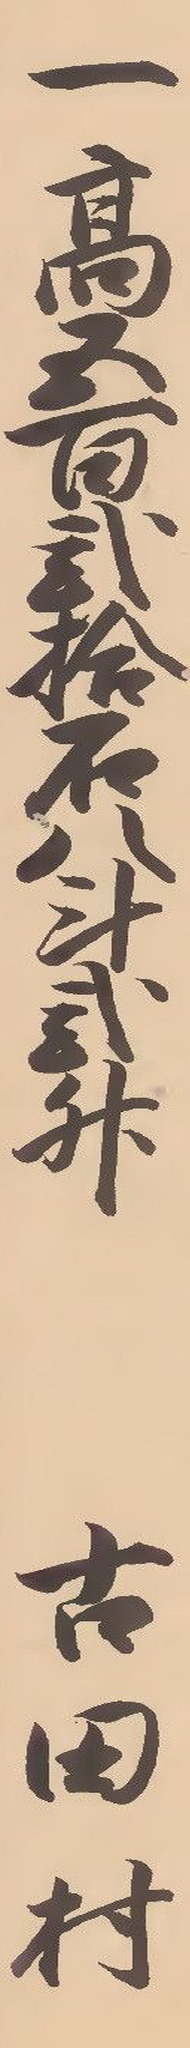一高五百弐拾石八斗弐升古田村
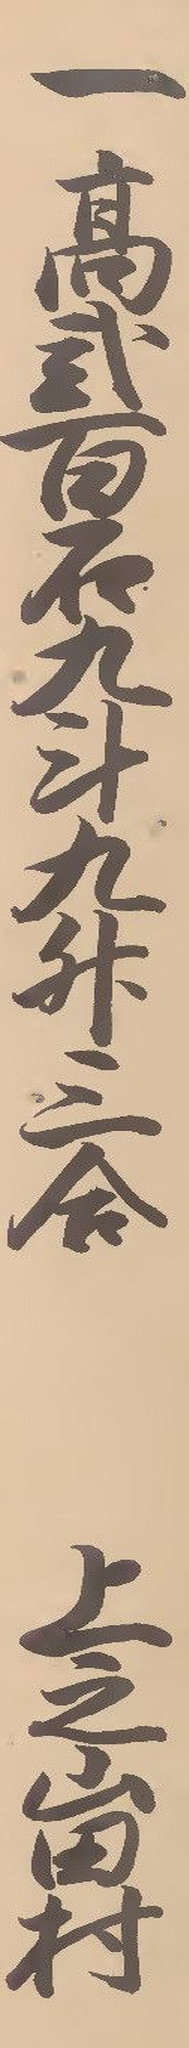一高弐百石九斗九升三合上之山田村
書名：伊勢国郷帳
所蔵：国立公文書館 National Archives of Japan
